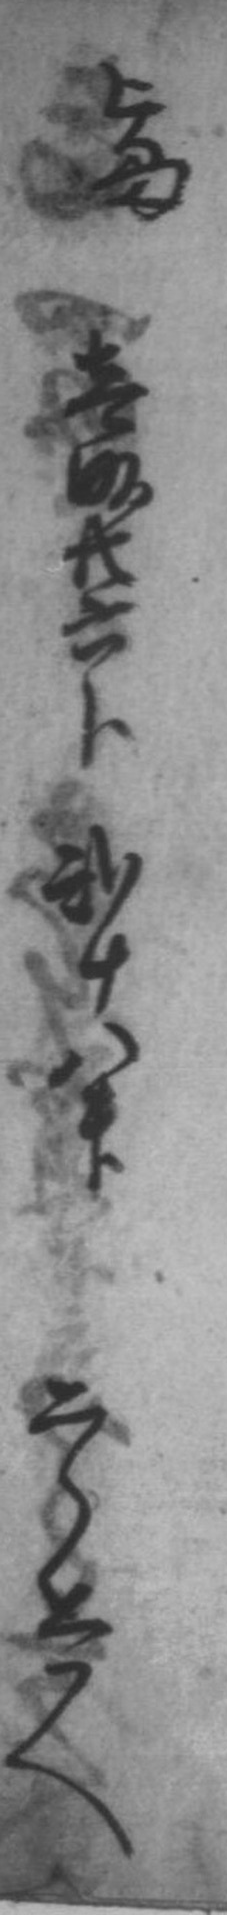上畠壱畝廿六分弐斗八升二郎左衛門

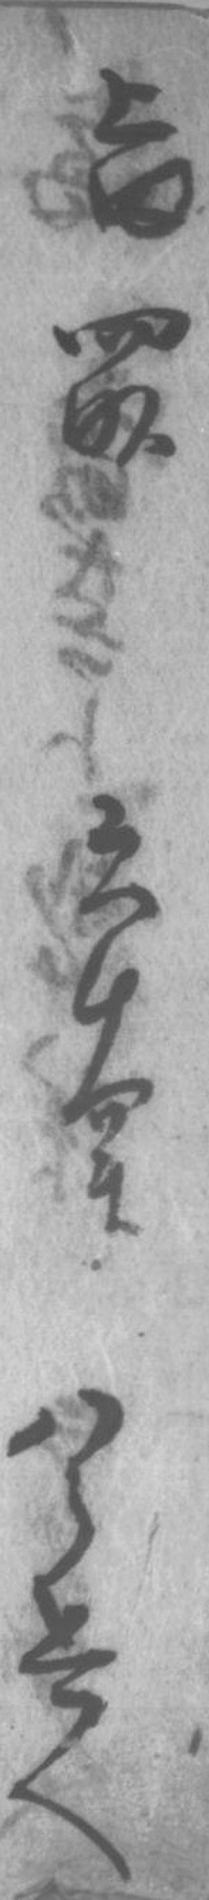上田四畝六斗四升八郎左衛門
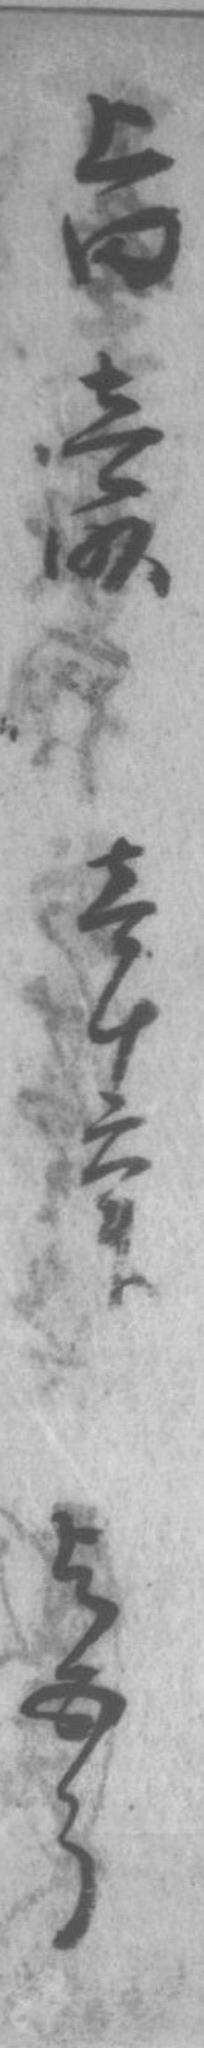上田壱畝壱斗六升与五郎
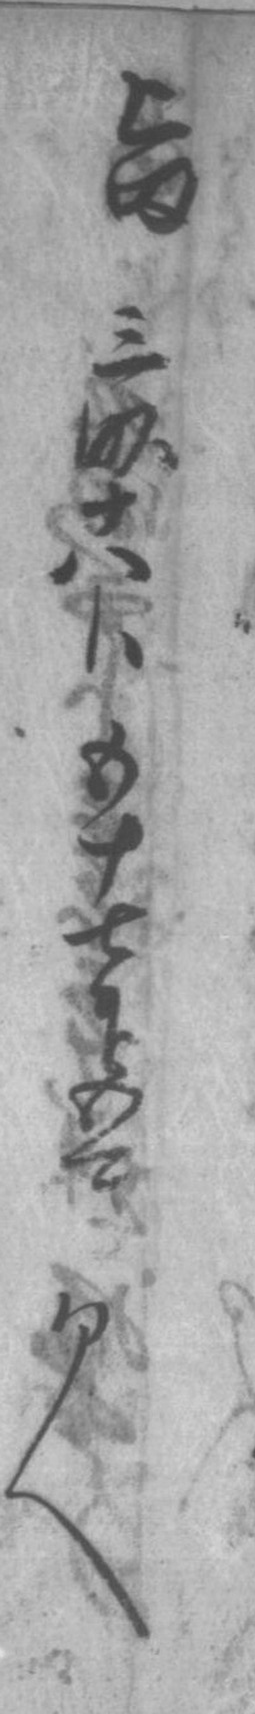上田三畝十八分五斗七升五合同人
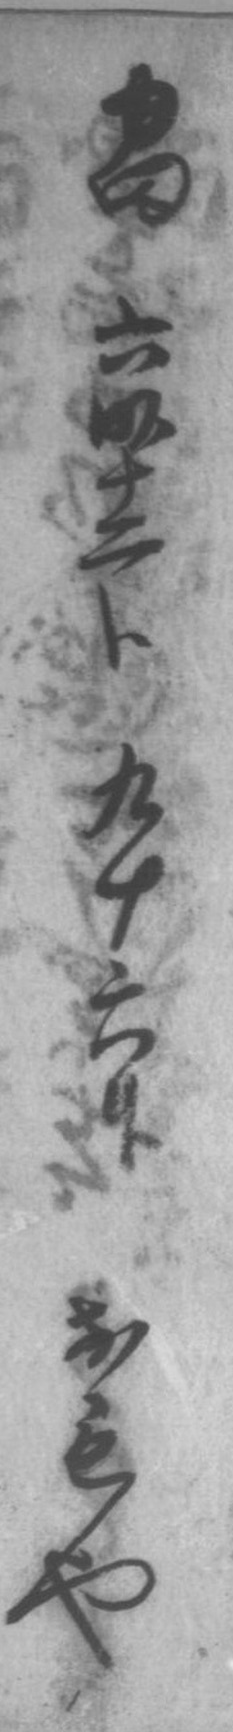中田六畝十二分九斗六升おもや
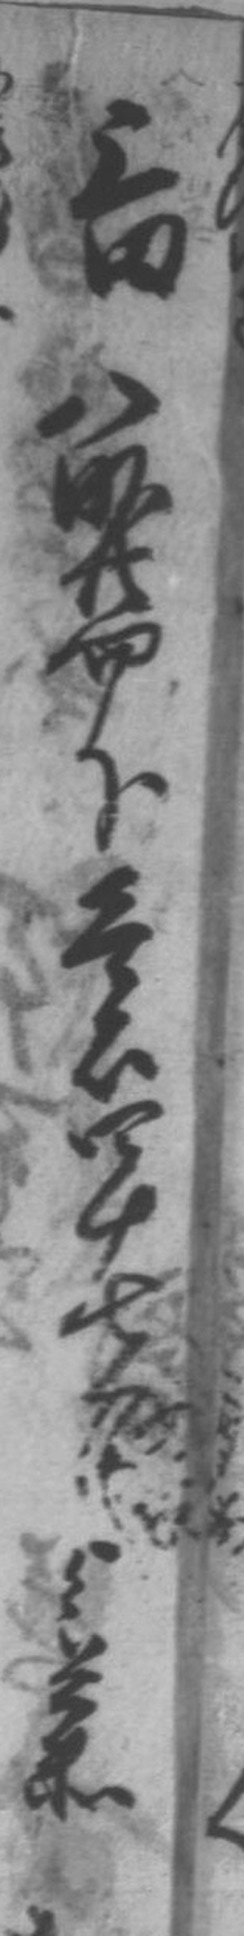上田八畝廿四分壱石四斗七合与兵衛
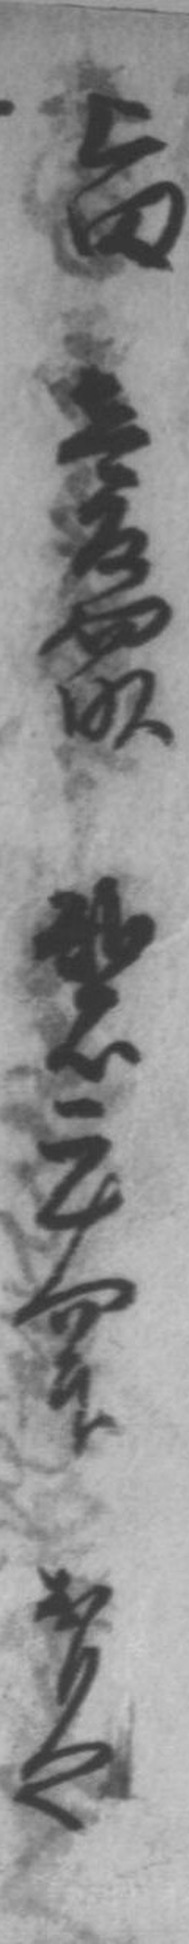上田壱反四畝弐石二斗四升おもや
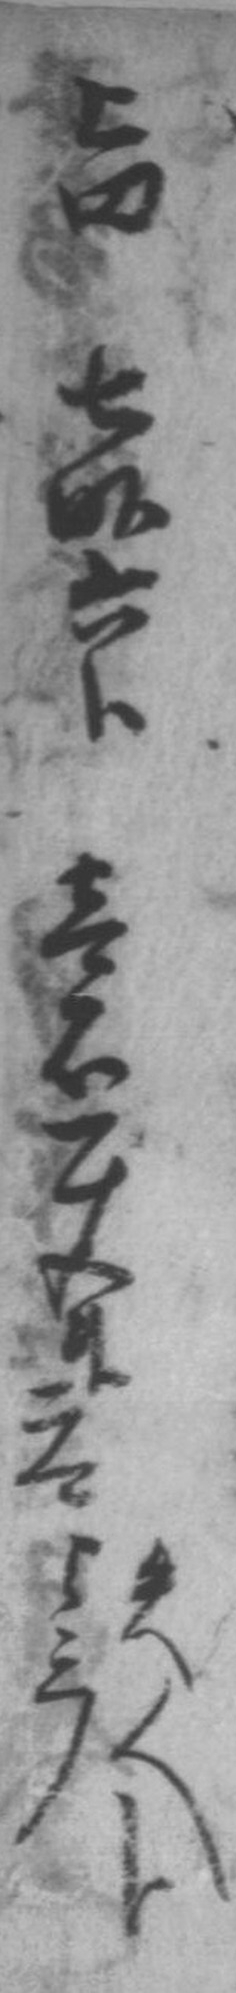上田七畝六分壱石一斗五升二合失人分
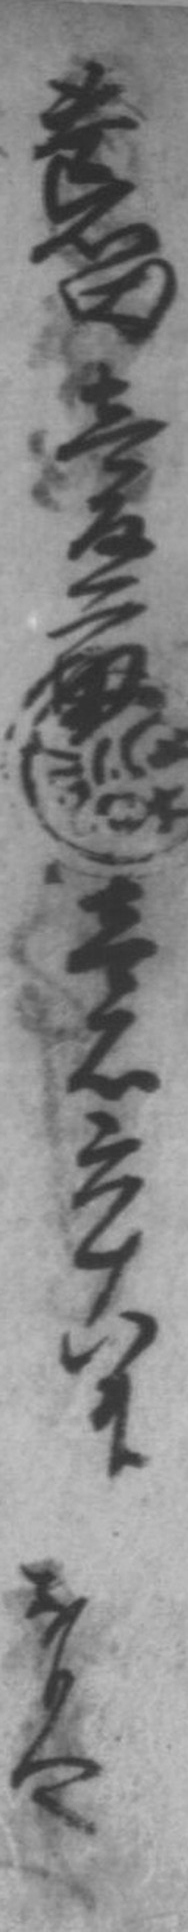石田壱反二セ壱石六斗八升おりや
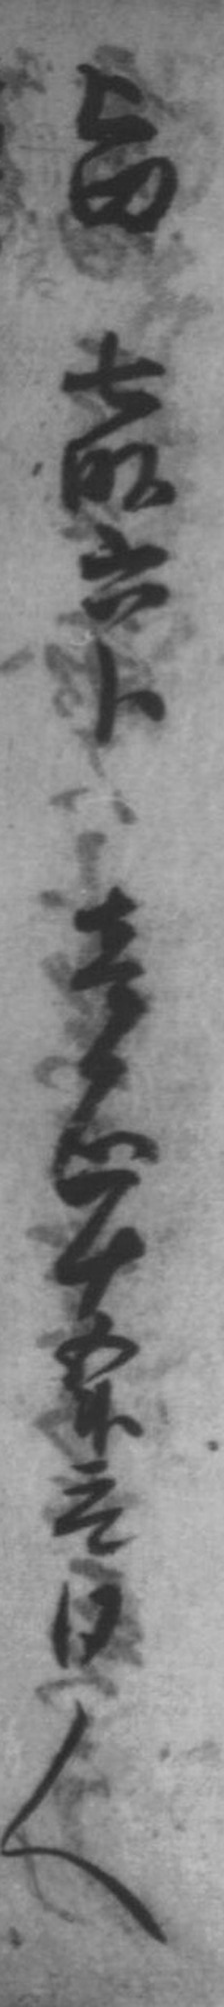上田七畝六分壱石四斗五升二合同人
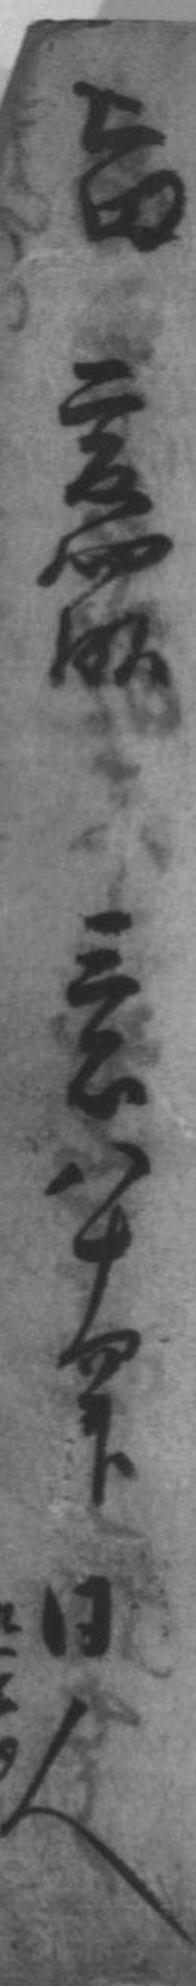上田二反四畝三石八斗四升同人

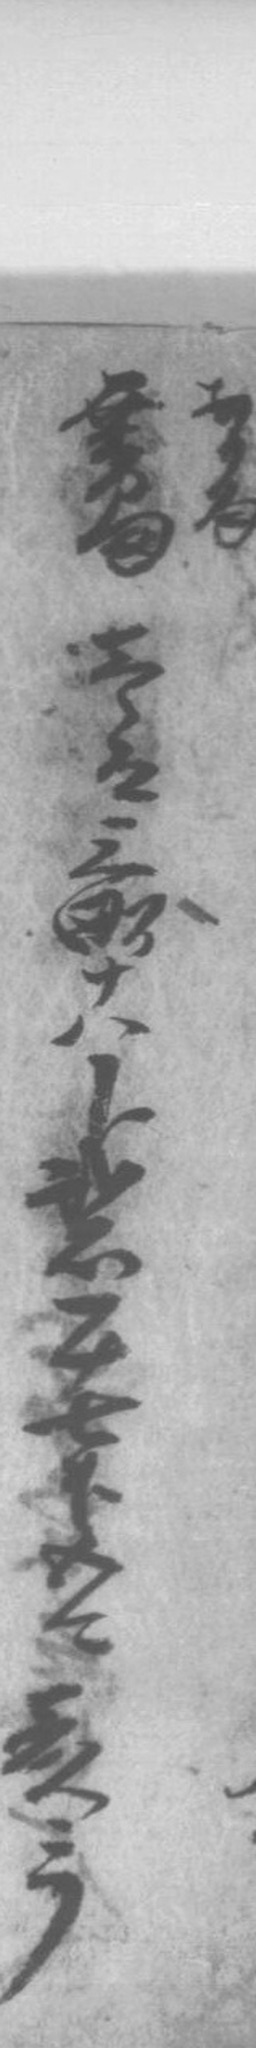桑畠壱反三畝十八分弐石一斗七升五合彦三郎
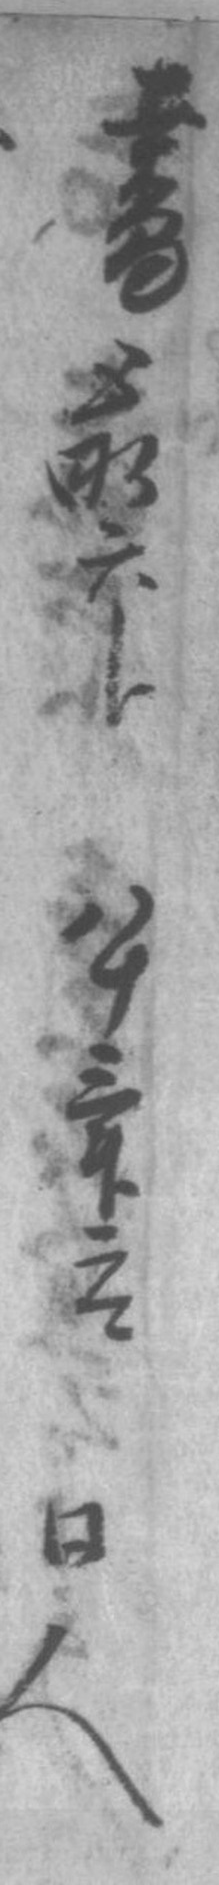桑畠五畝六分八斗三升二合同人
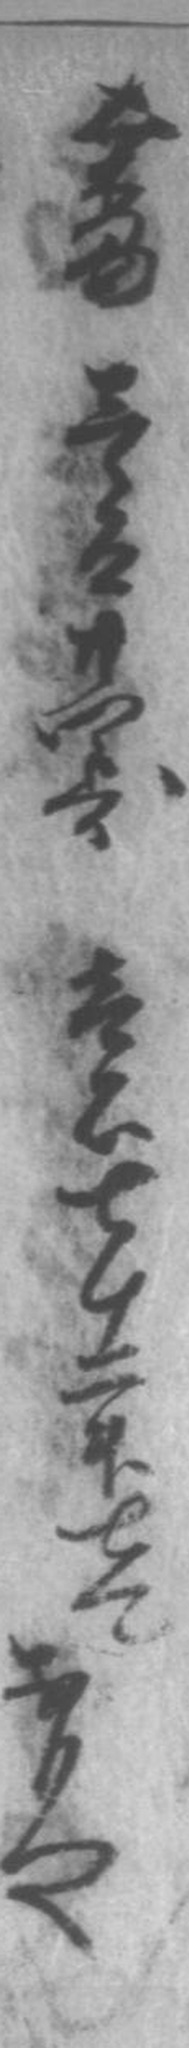桑畠壱反廿四歩壱石七斗二升七合おりや
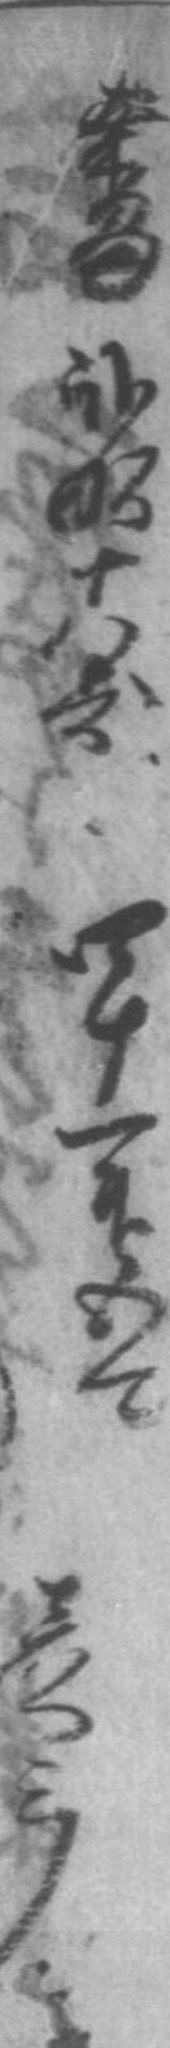桑畠弐畝十八分四斗一升五合彦三郎
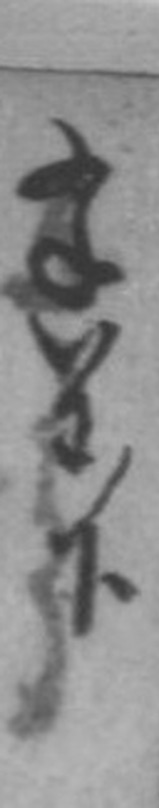字岩下
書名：越州大野郡ノ内不動堂村御検地帳
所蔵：福井県文書館 Fukui Prefectural Archives
